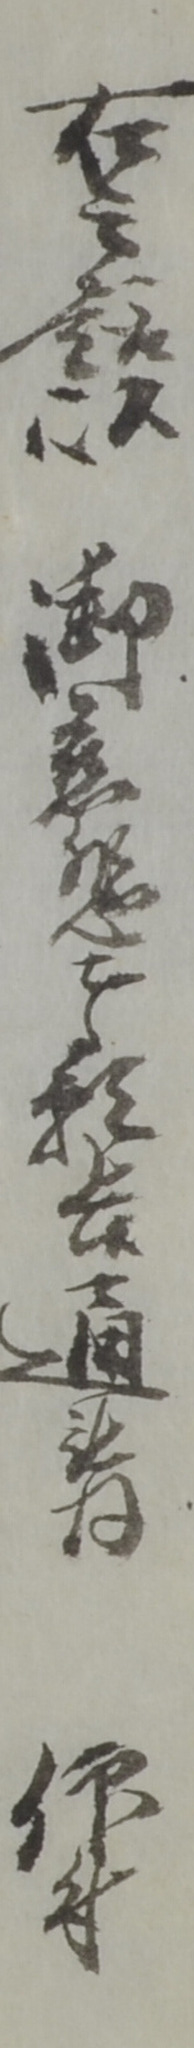右之趣以御慈悲奉願上候通被為仰付
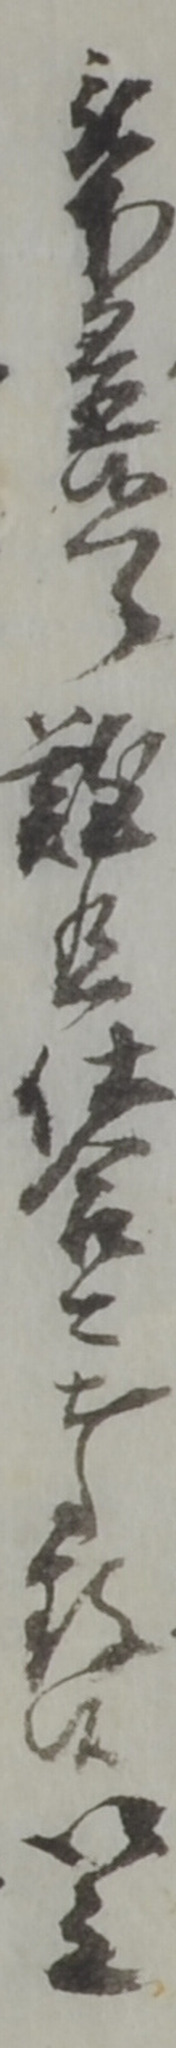被下置候ハヽ難有仕合ニ奉存候以上
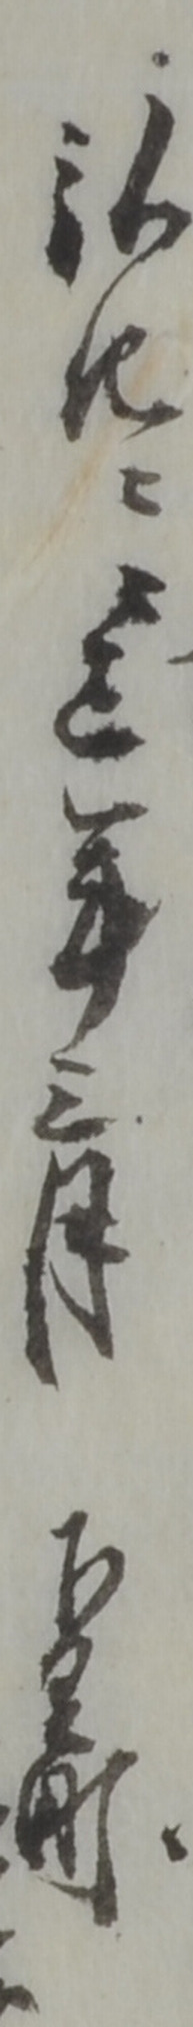弘化二乙巳年三月下里町
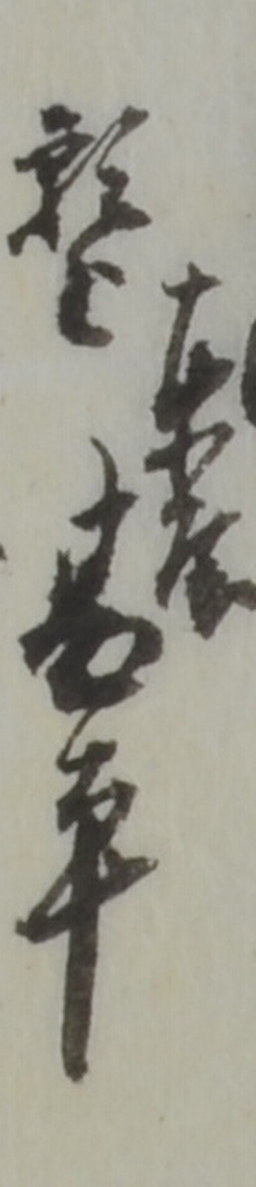願主甚平
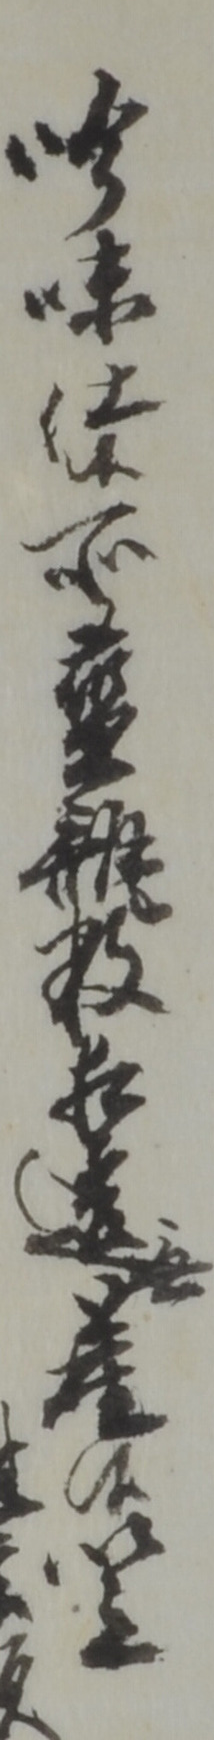吟味仕候所藍瓶数相違無差候以上
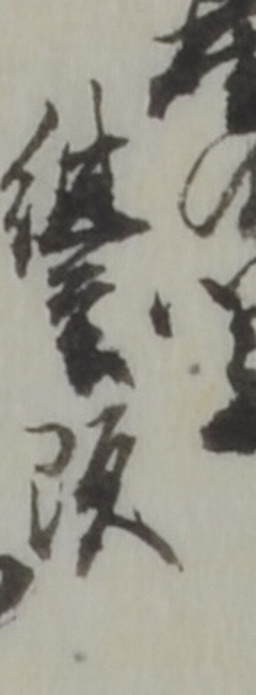紺屋頭
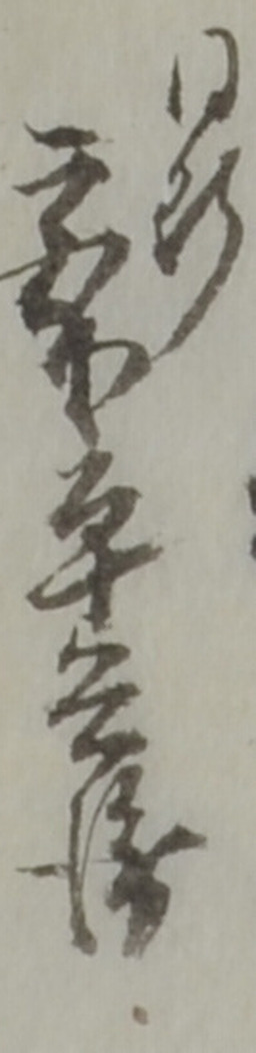宮木平兵衛
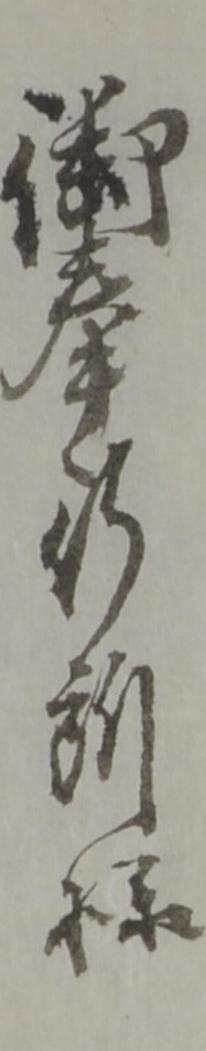御奉行所様
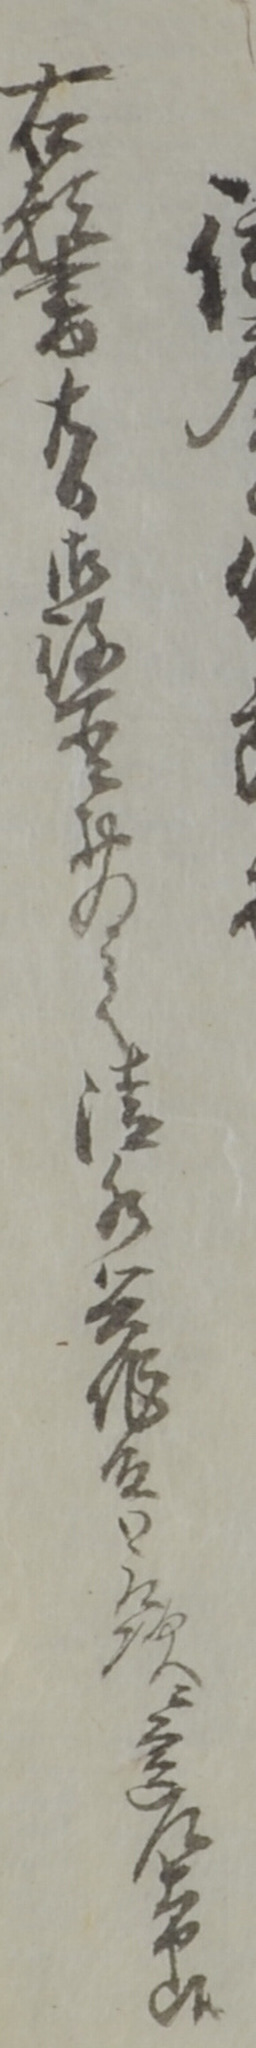右願書廿日御役所ニおゐて清水兵作殿御取次ニ而差上申候
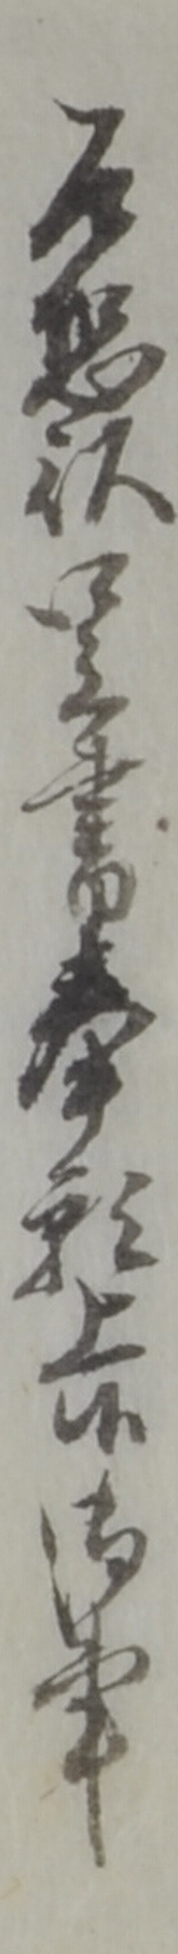乍恐以口上書奉願上候御事
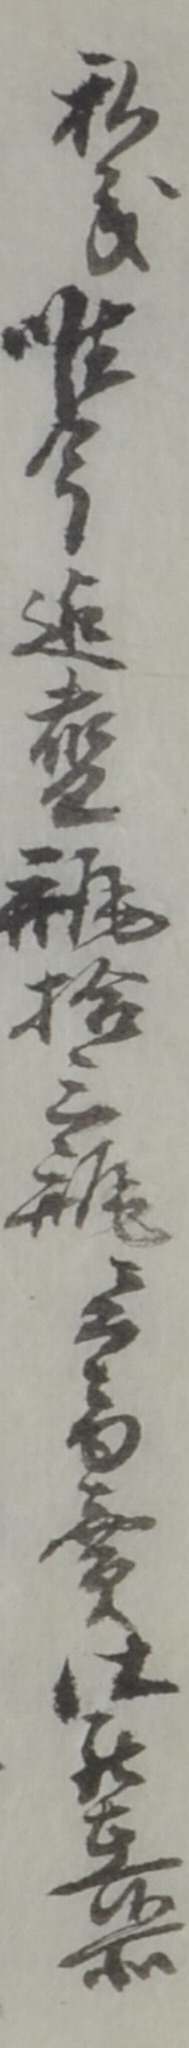私義唯今迄藍瓶拾三瓶ニ而商売仕罷在候所
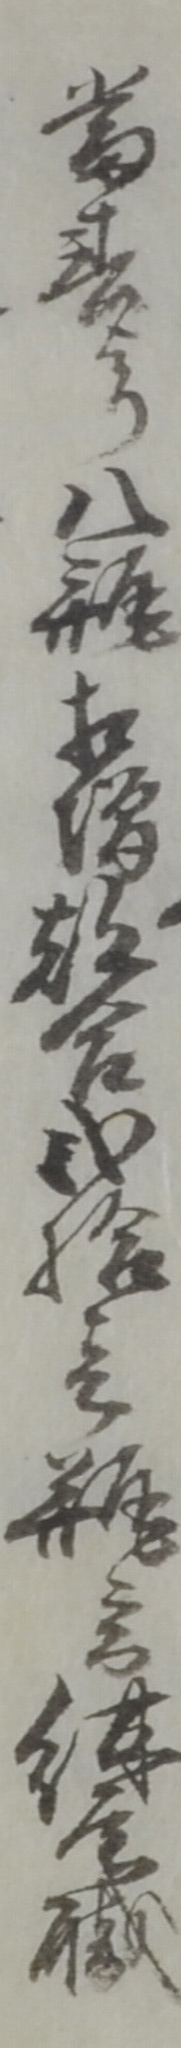当春ゟ八瓶相増都合弐拾壱瓶ニ而紺屋職
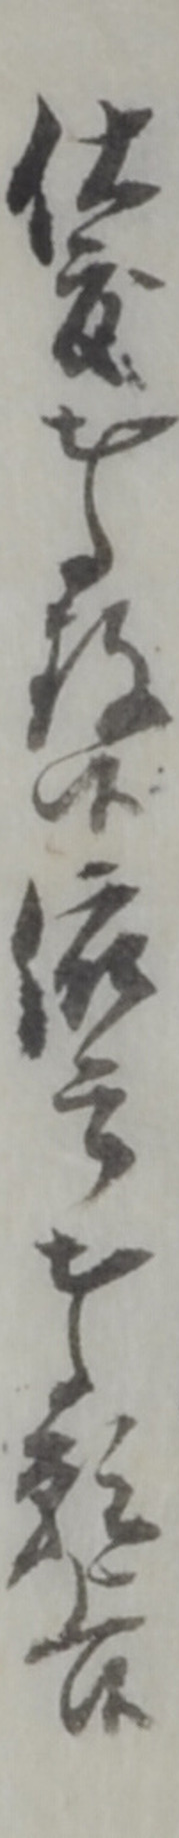仕度奉存候依之奉願上候

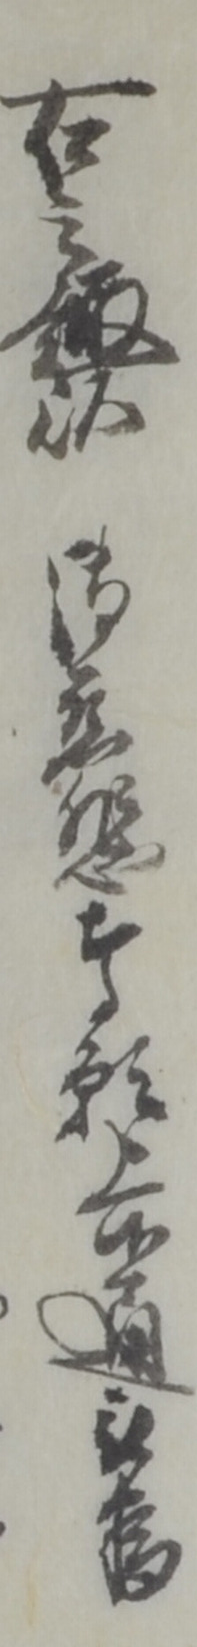右之趣以御慈悲奉願上候通被為仰付
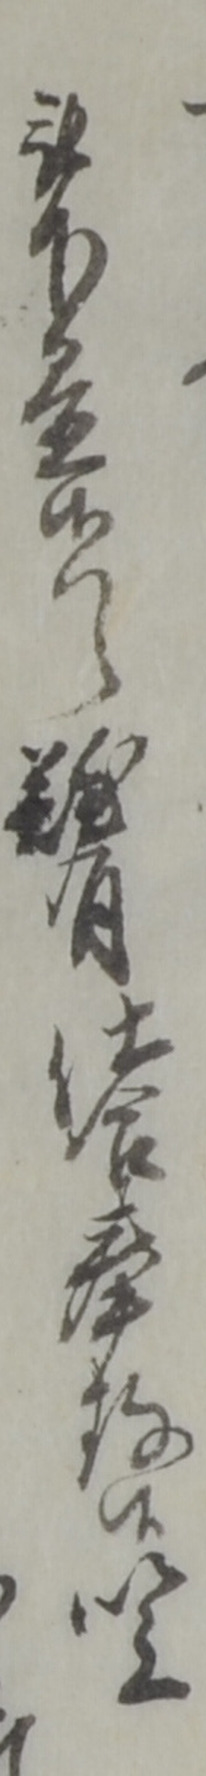被下置候ハヽ難有仕合奉存候以上
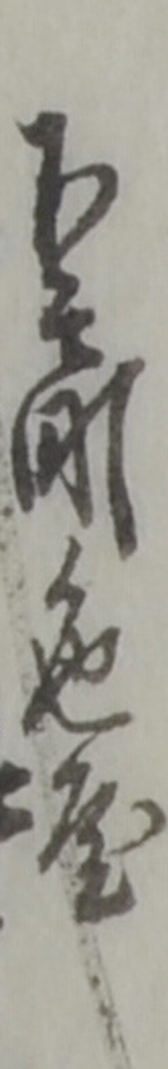下モ町色屋
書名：諸願書控簿
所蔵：伊那市立高遠町図書館・合同会社AMANE
